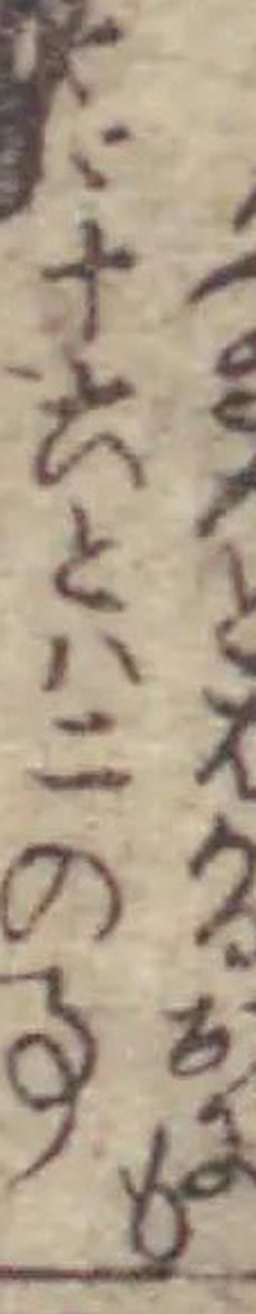十六とはこの事
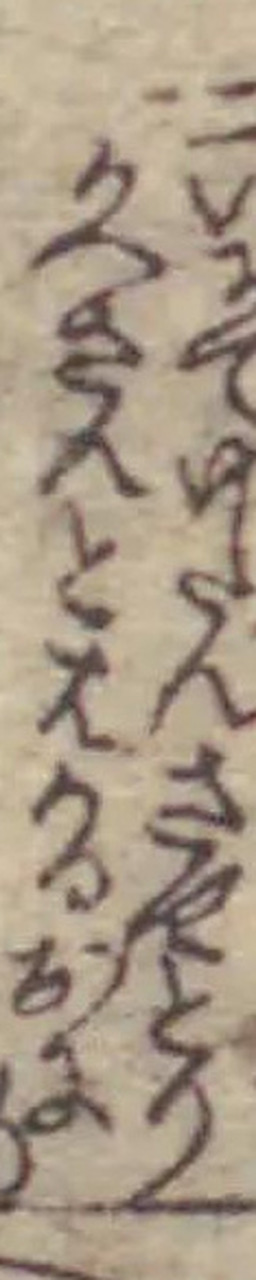かへさんとはかるおにも
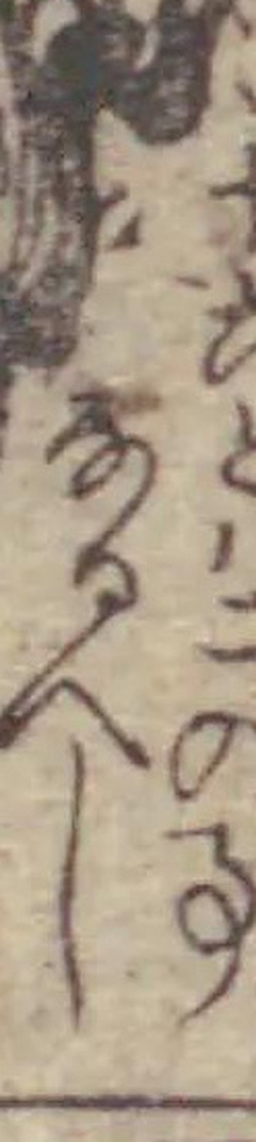なるへし
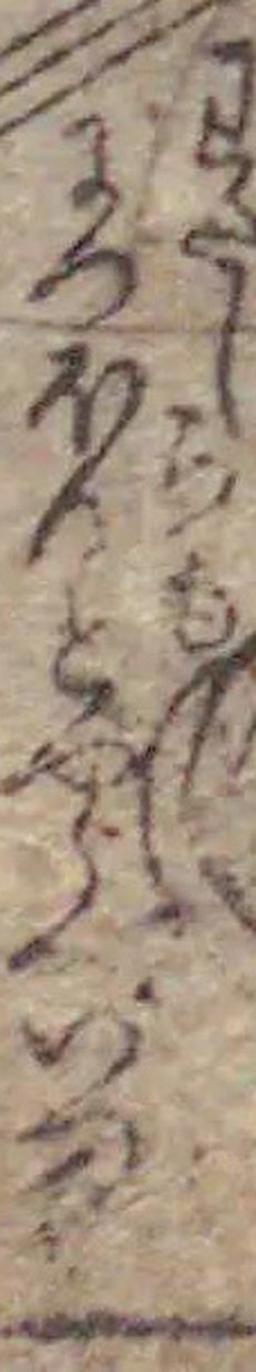につほんとやらへいつて
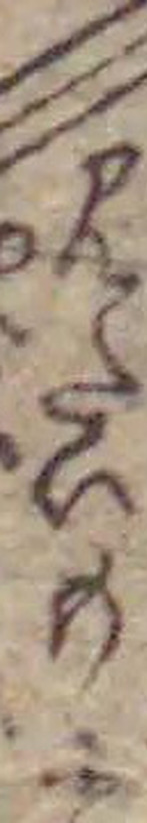見たいも
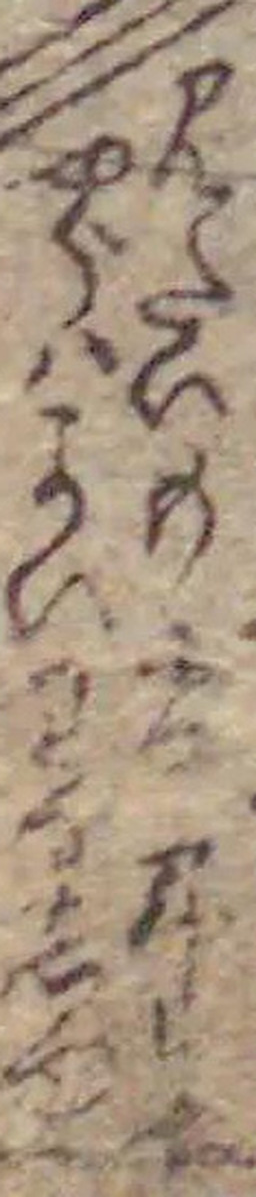やらはよいわるしゆ

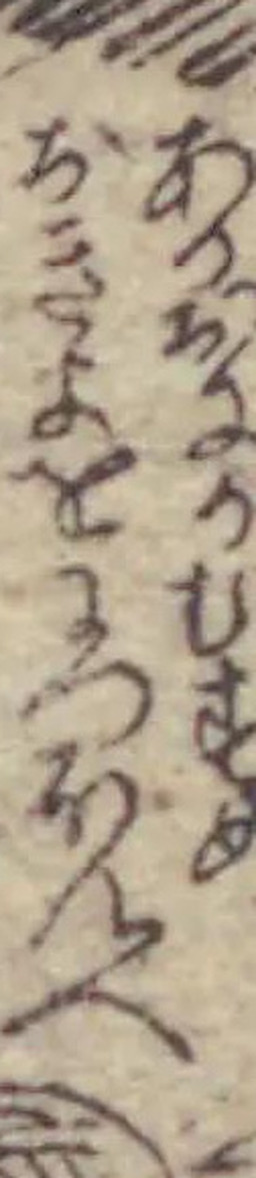おきよをにつほんへ
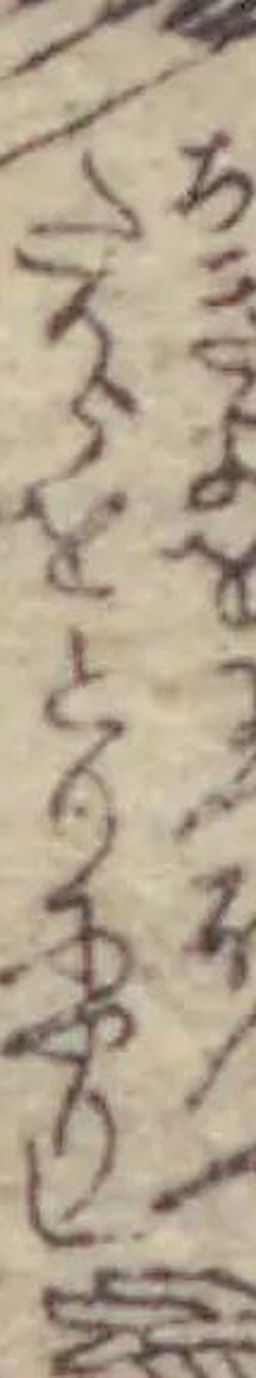たからをとりにやりし
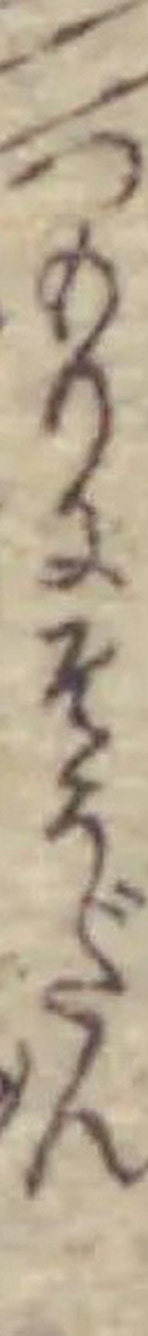つもりにそうだん
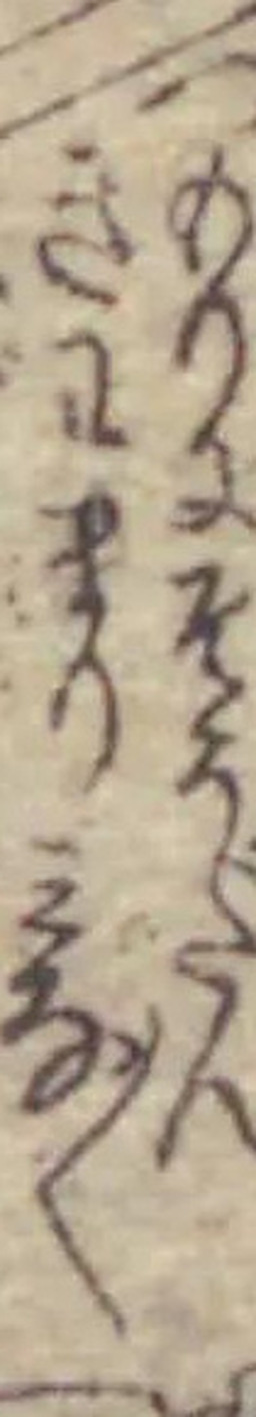きわまりみな〳〵
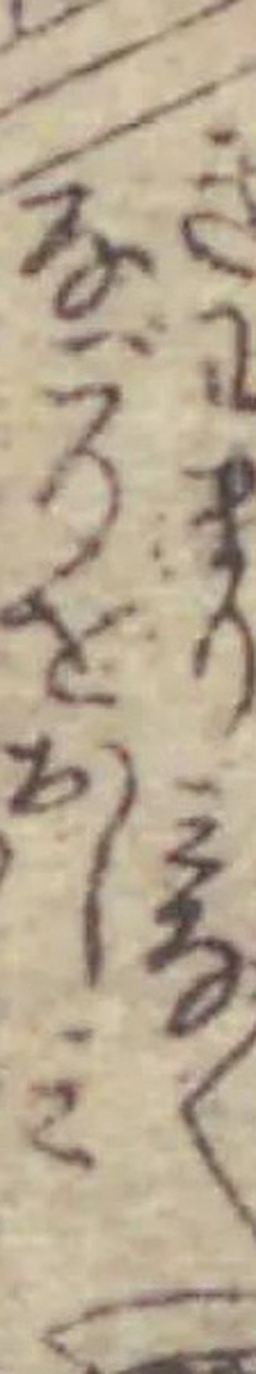なごりをおしみ
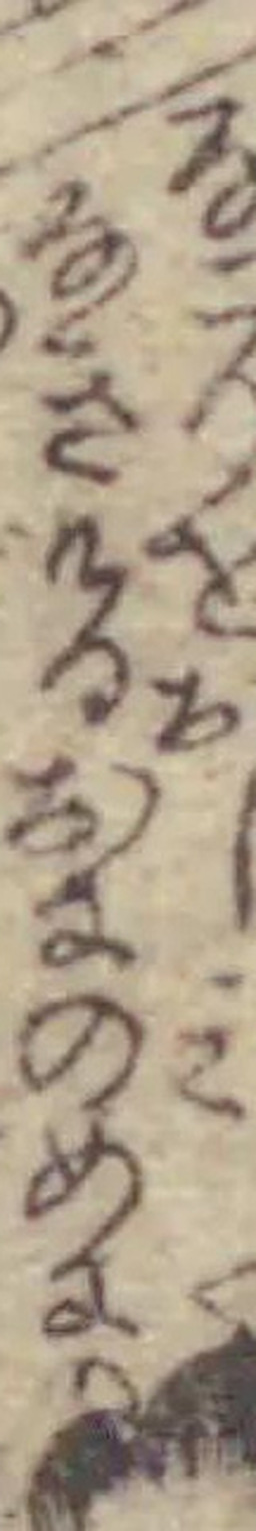なきけるおにのめに
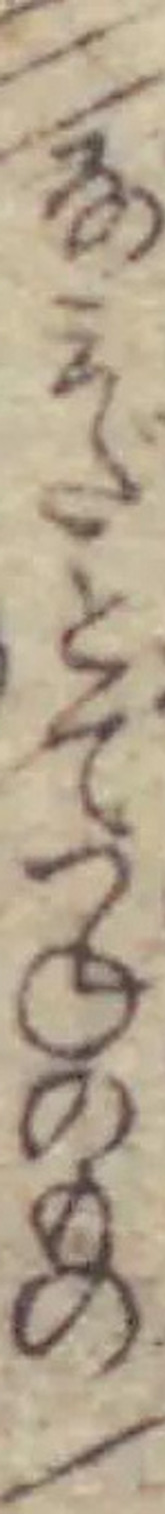なみだとてつねのもの
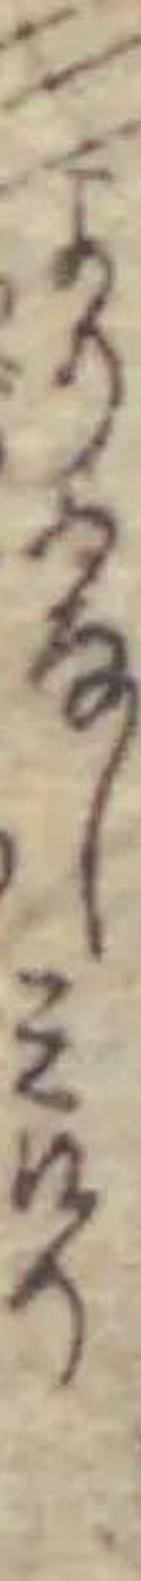よりかなしみけり
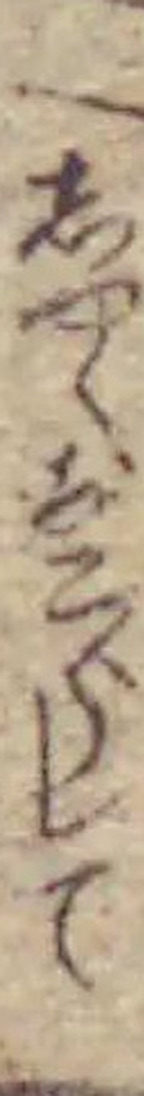しやくおこらして
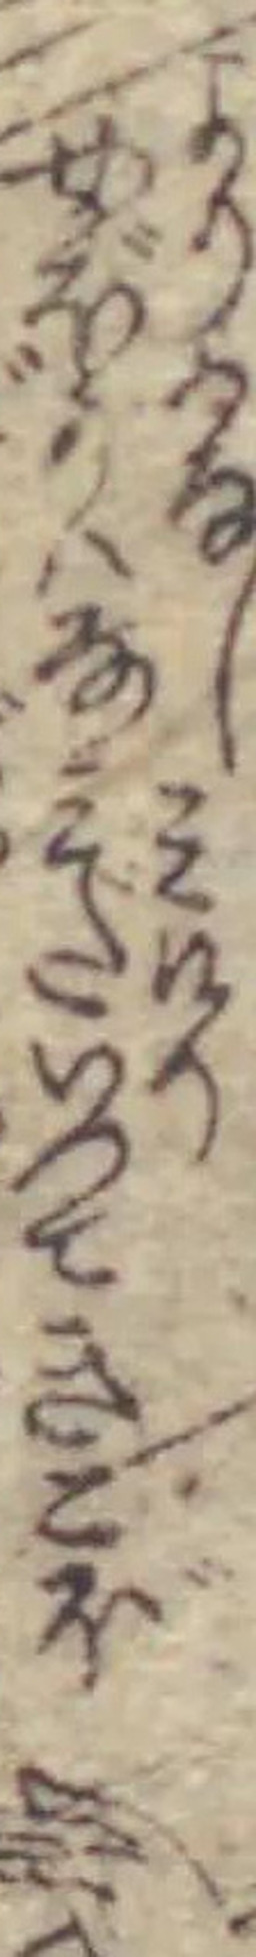女ぼうはなみだいつてきこほ
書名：桃太郎元服姿 2巻
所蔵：国立国会図書館 National Diet Library, JAPAN
